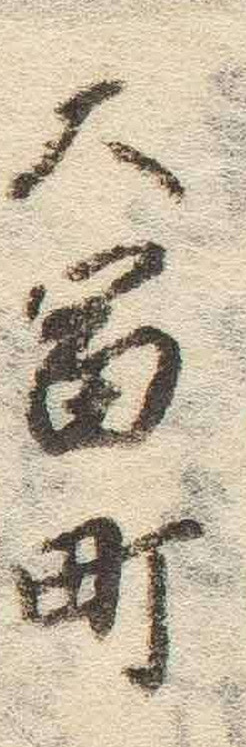大富町
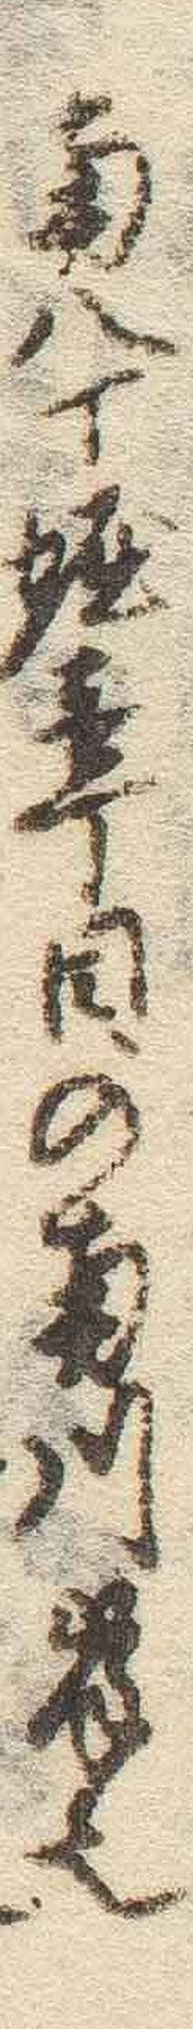南八丁堀壱丁目の南川岸也
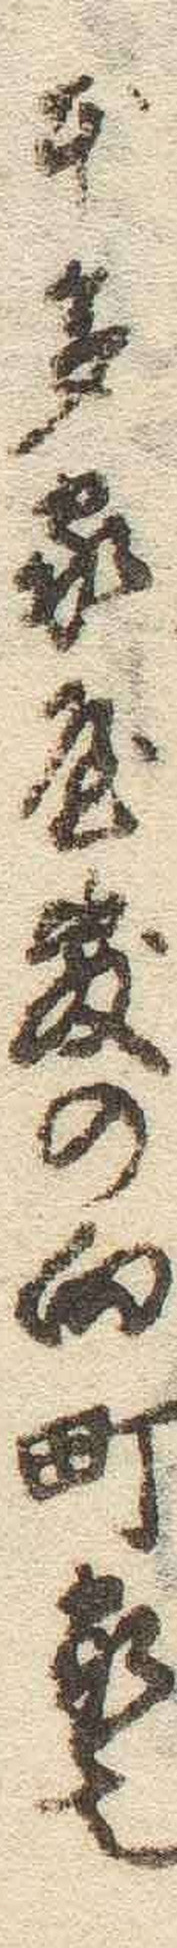本多家屋敷の向町家也
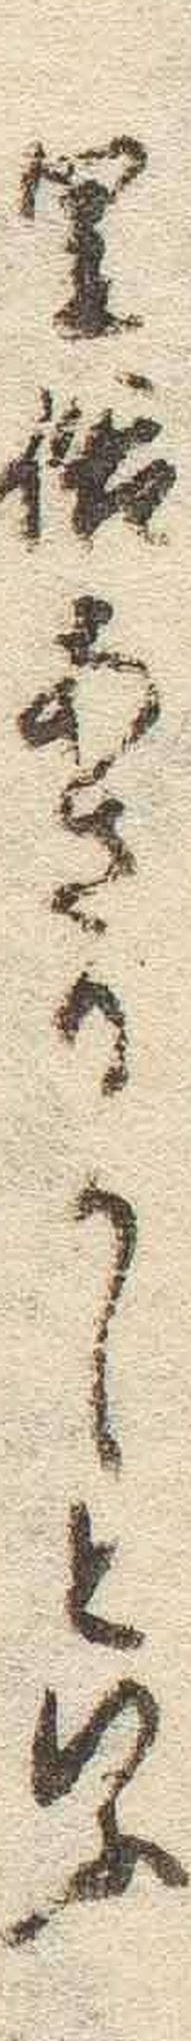里俗あさりかしといふ
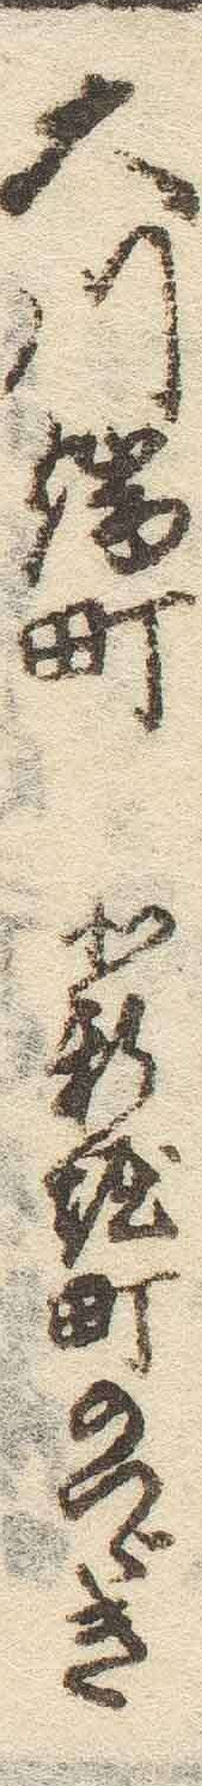大川端町北新掘町のつゞき
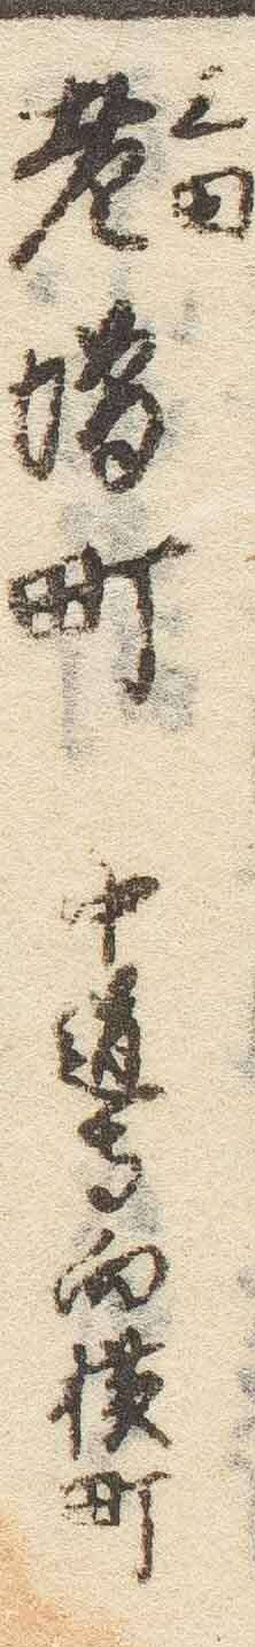老増町中道寺向横町
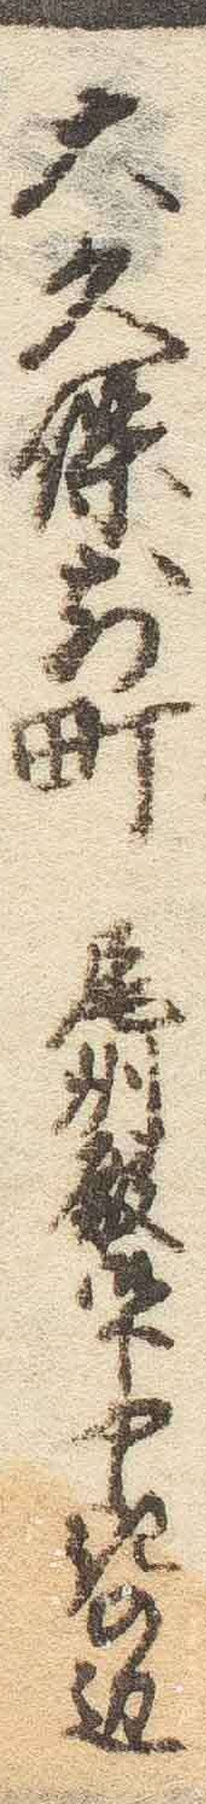大久保前町尾州殿御下やしきの辺
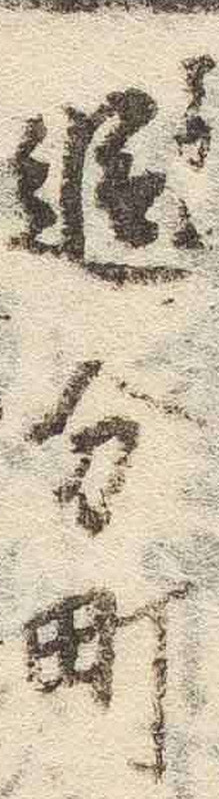追分町
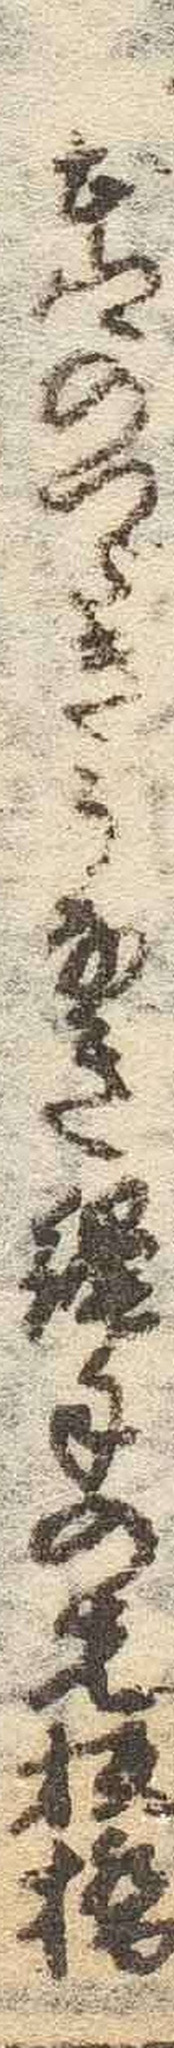本郷のつゞきうなき縄手の先板橋
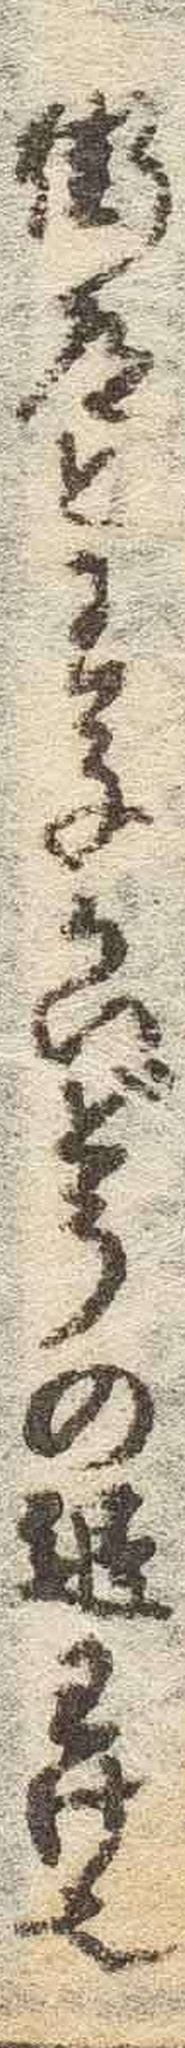街道と王子かいどうの追わけ也
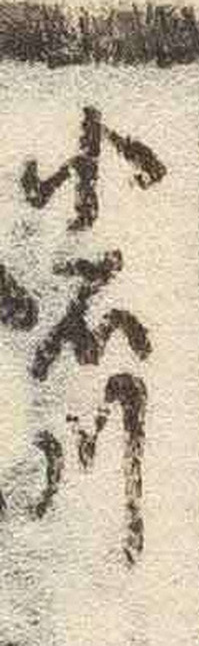小石川
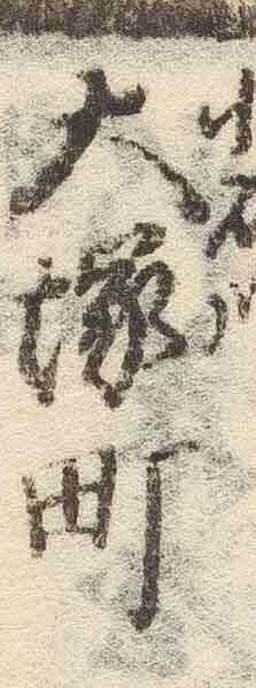大富町
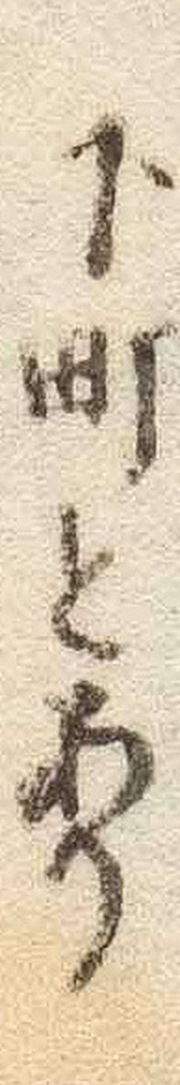下町とあり
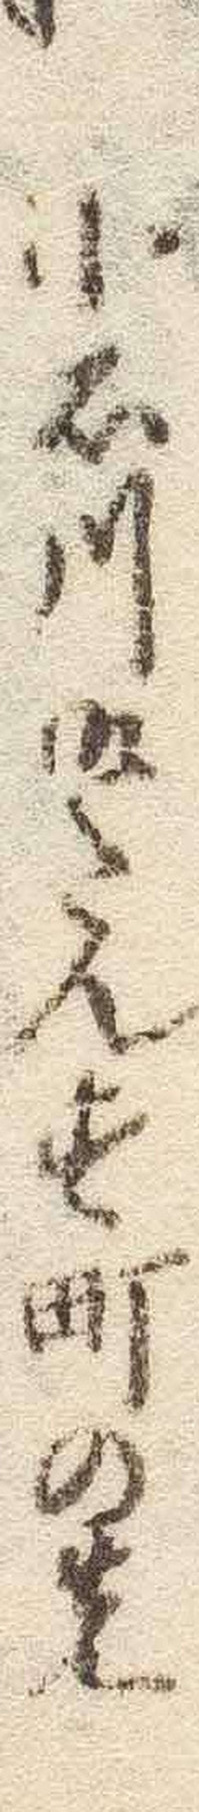小石川御たんす町の先
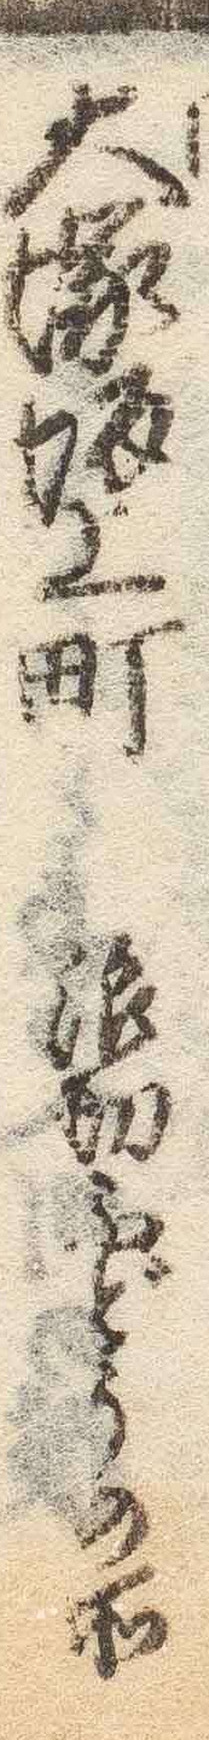大塚坂上町浪切ふどうの所
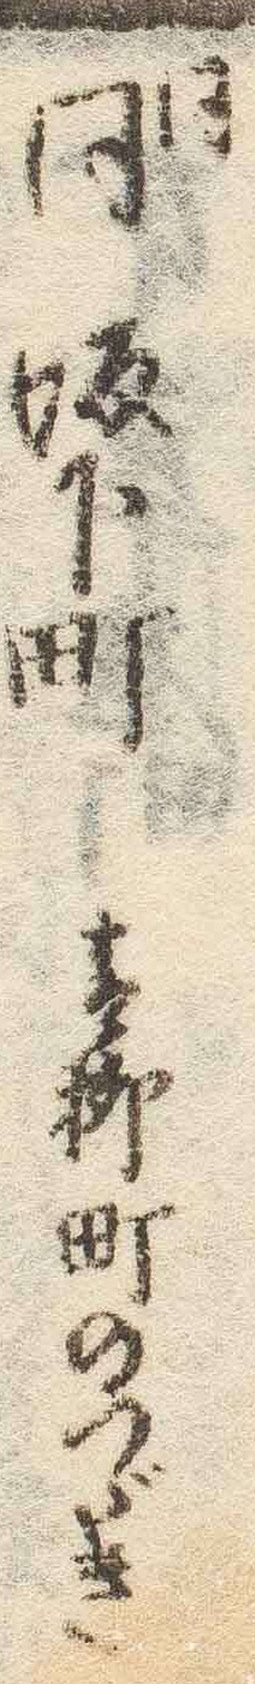同坂下町青柳町のつゞき
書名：江戸町独案内
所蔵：東京学芸大学附属図書館 国文学研究資料館
